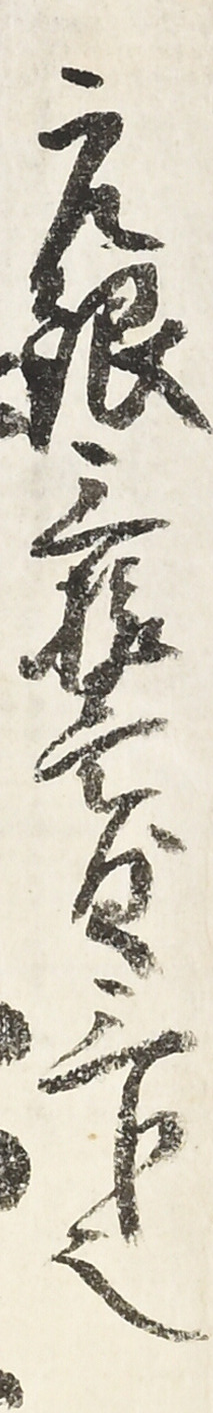元銀三拾壱匁三分也
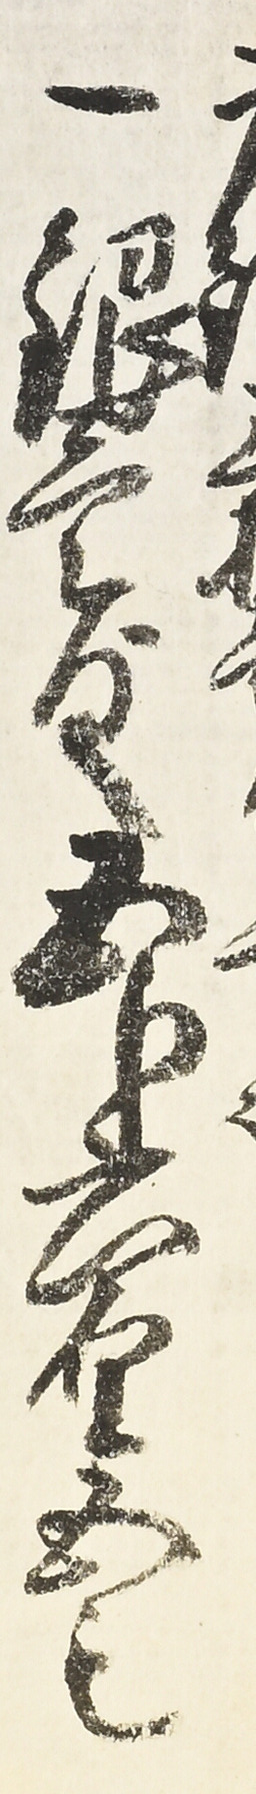一銀壱匁五分六厘五毛
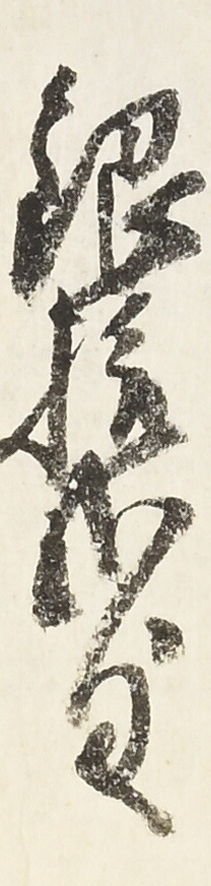銀拾弐匁
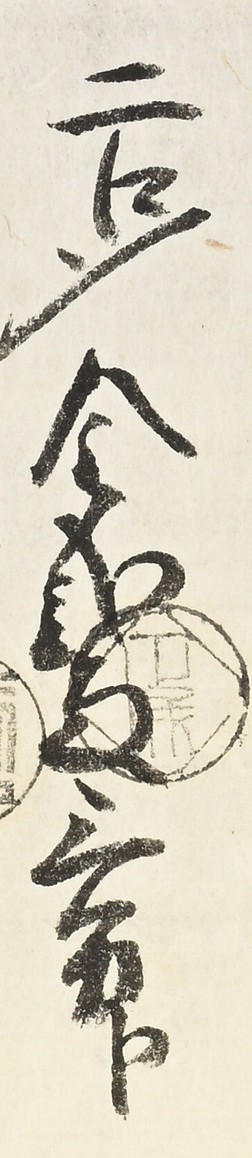二口〆金弐両三分ト
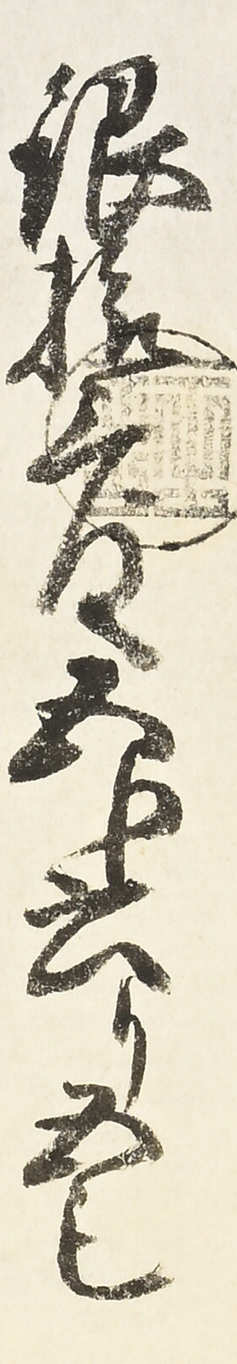銀拾三匁五分六厘五毛
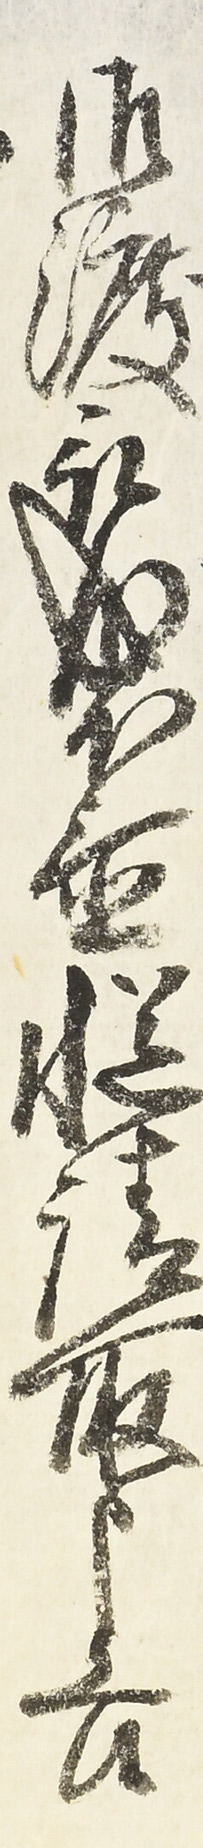御渡被成下置慥請取申上候
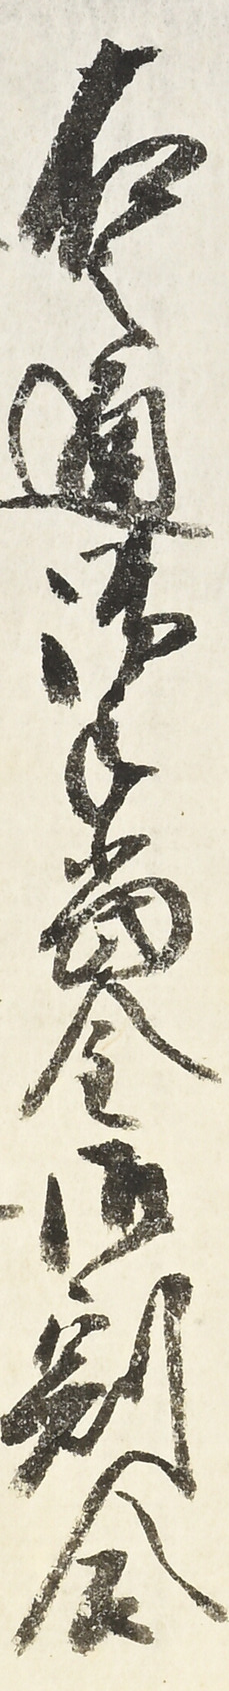右之通御手当金御割合
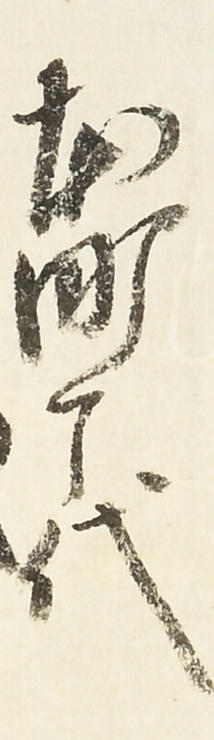本町丁代
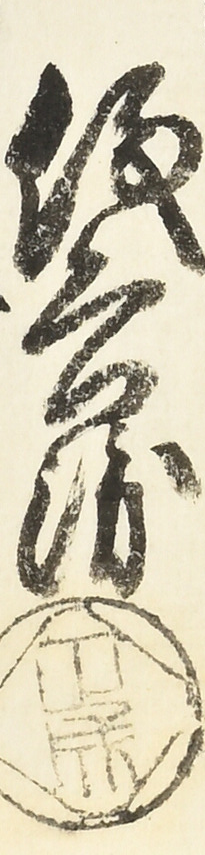儀兵衛
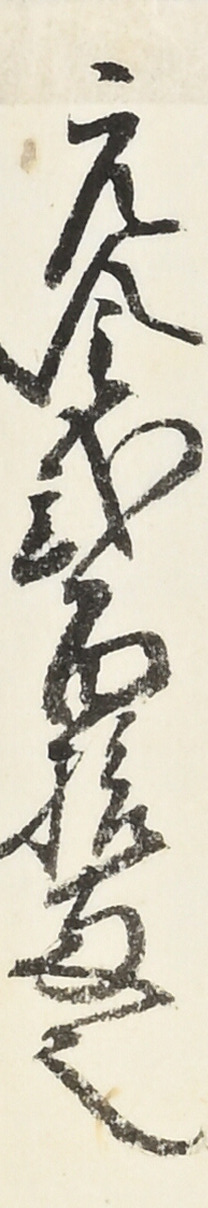元金弐百拾両也
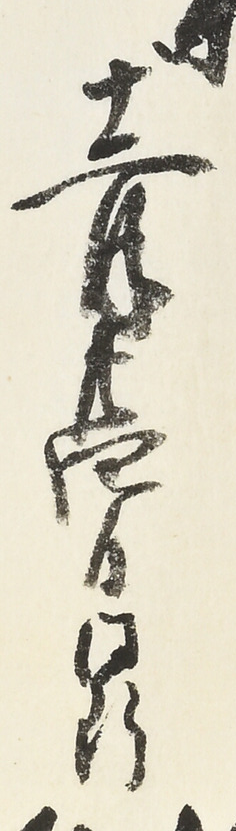未十二月廿四日同断
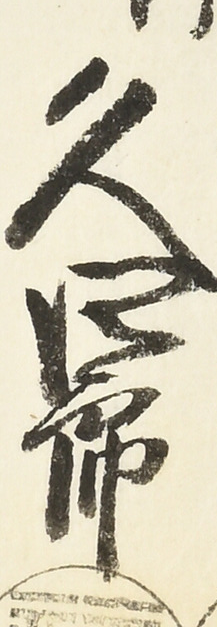久四郎
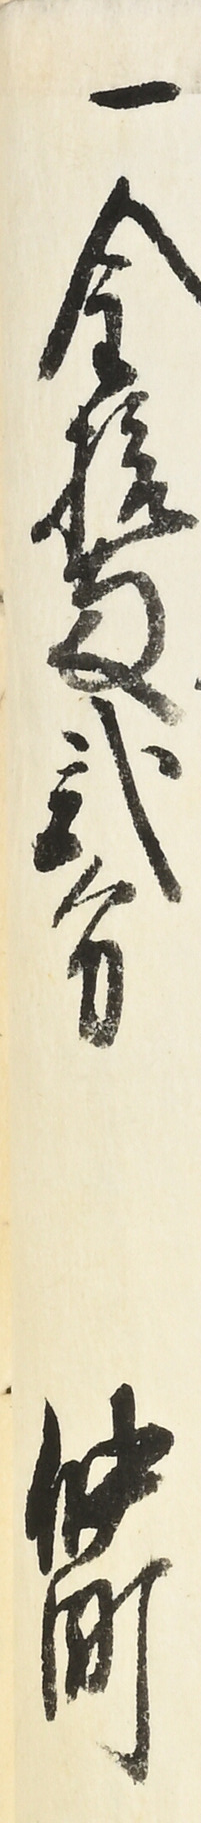一金拾両弐分仲町
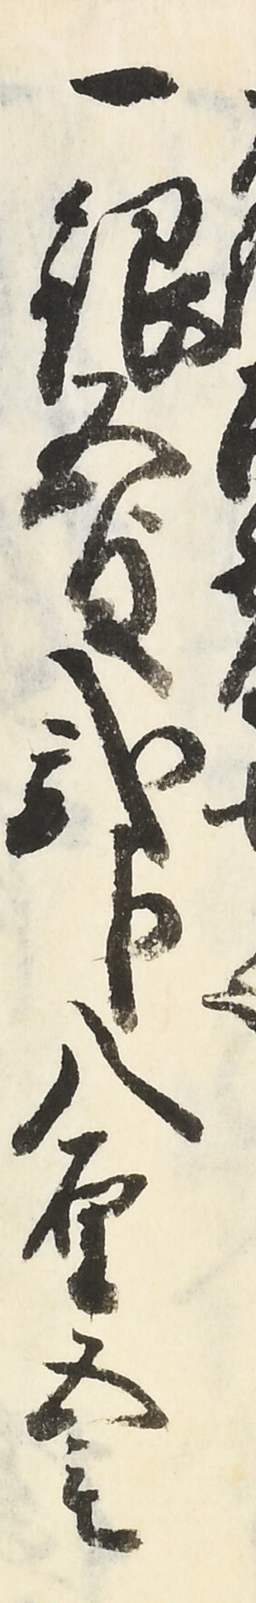一銀壱匁五分六厘五毛
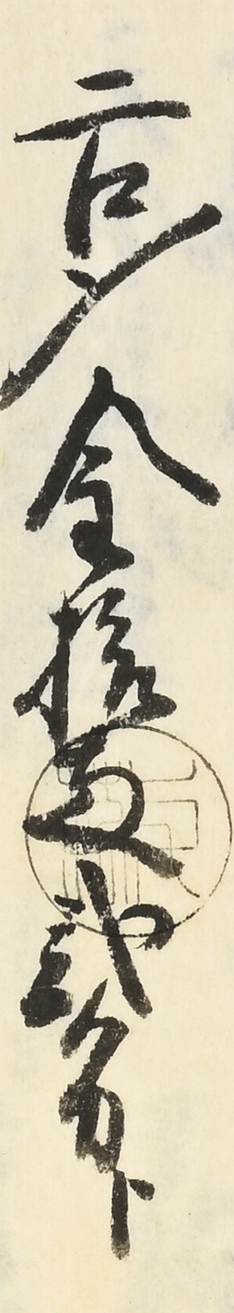二口〆金弐両三分ト

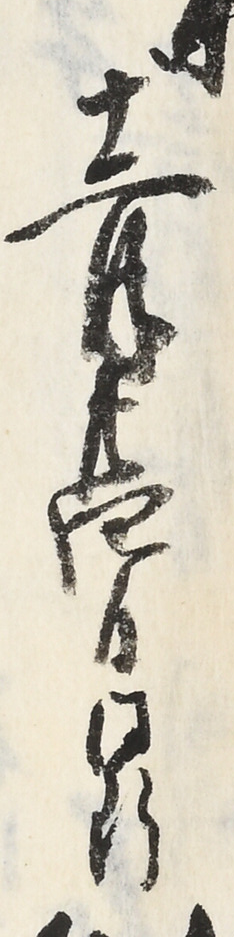十二月廿四日同断
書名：御才覚金御利足割渡扣帳
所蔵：伊那市立高遠町図書館・合同会社AMANE
